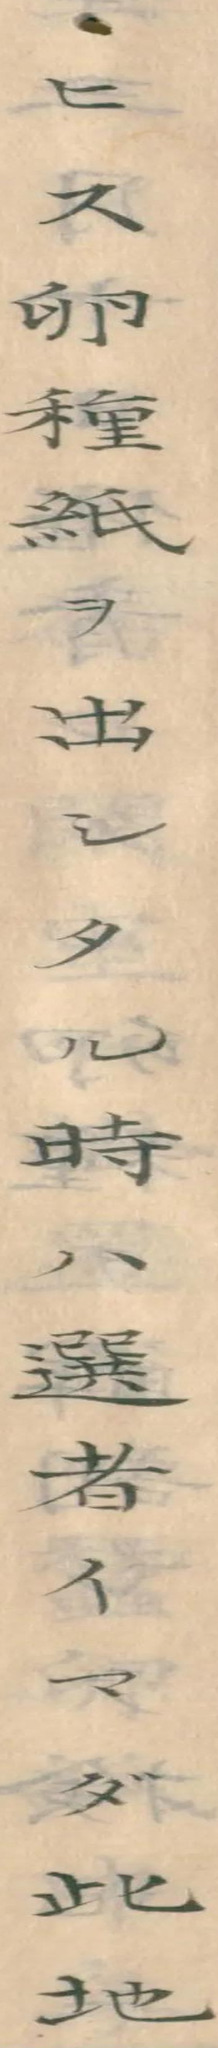ヒス卵種紙ヲ出シタル時ハ選者イマダ此地
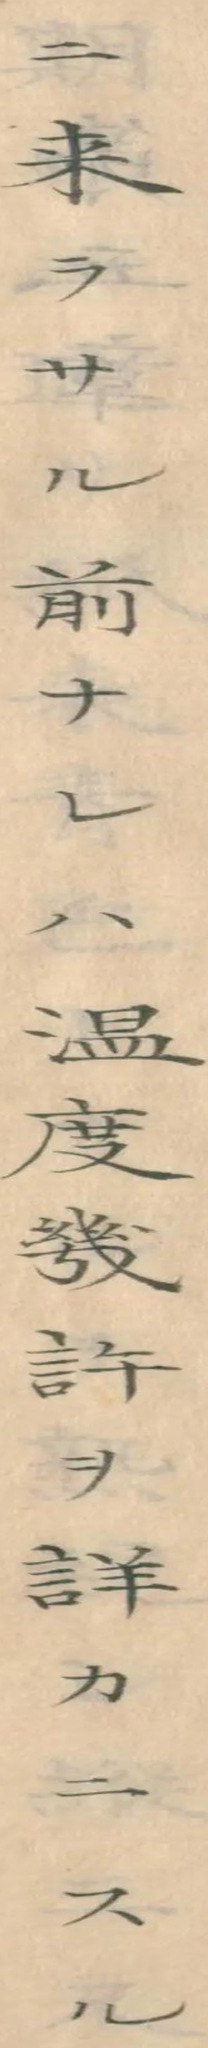ニ来ラサル前ナレハ温度幾許ヲ詳カニスル
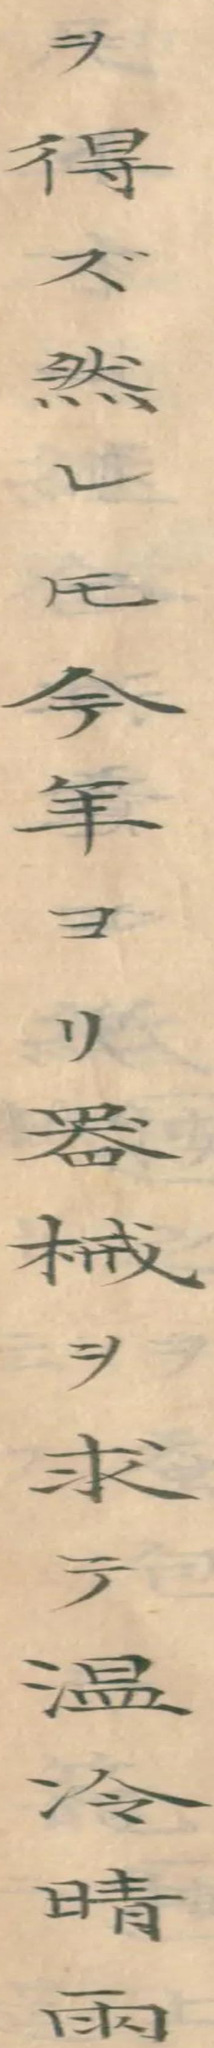ヲ得ズ然レトモ今年ヨリ器械ヲ求テ温冷晴雨

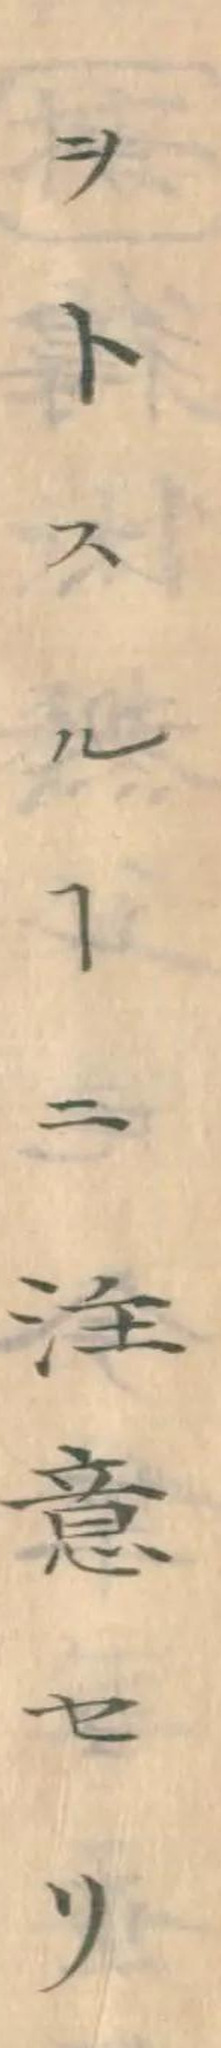ヲ卜スルコトニ注意セリ
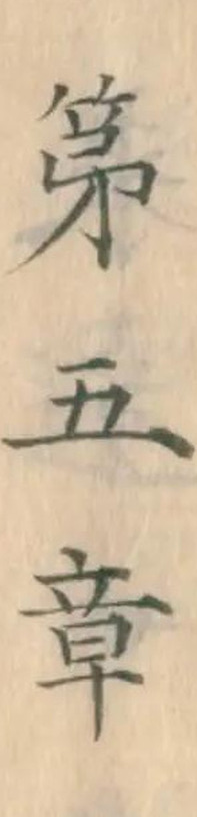第五章
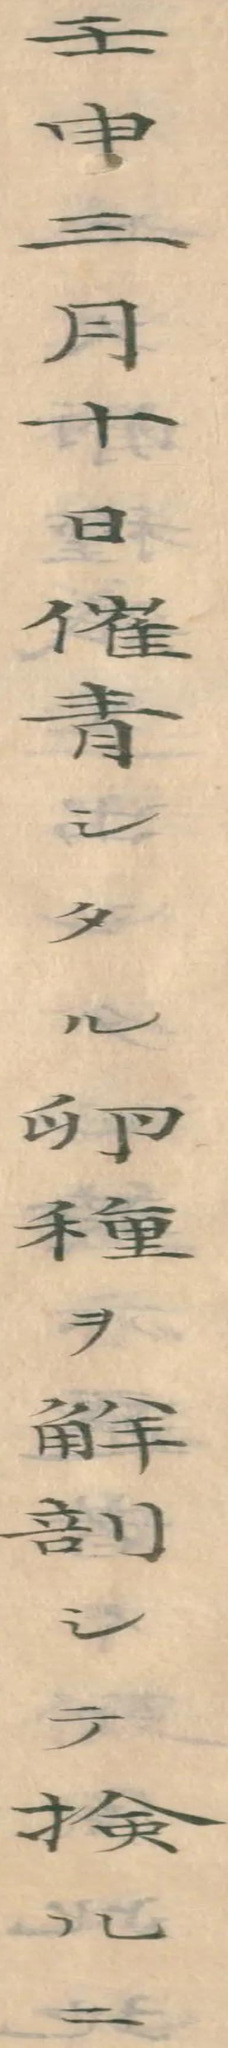壬申三月十日催青シタル卵種ヲ解剖シテ𢮦ルニ
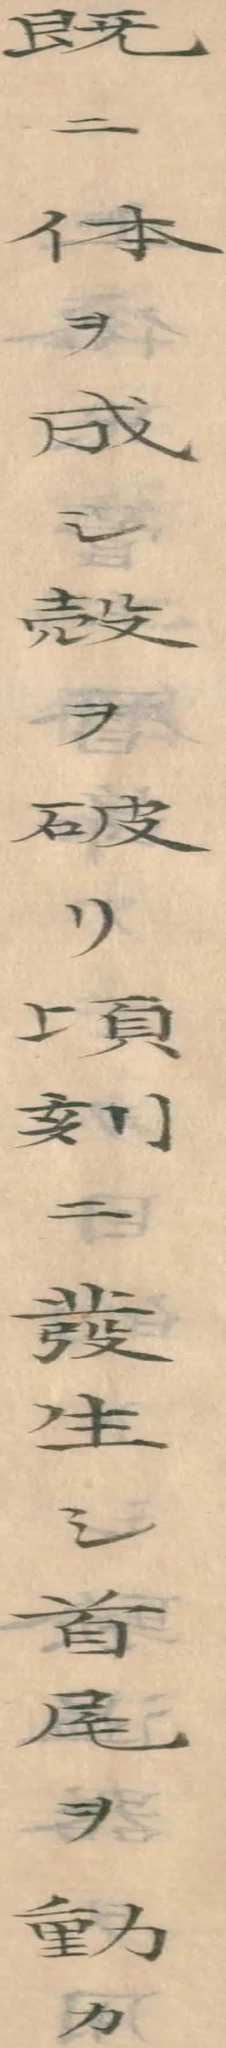既ニ体ヲ成シ殻ヲ破リ頃刻ニ発生シ首尾ヲ動カ
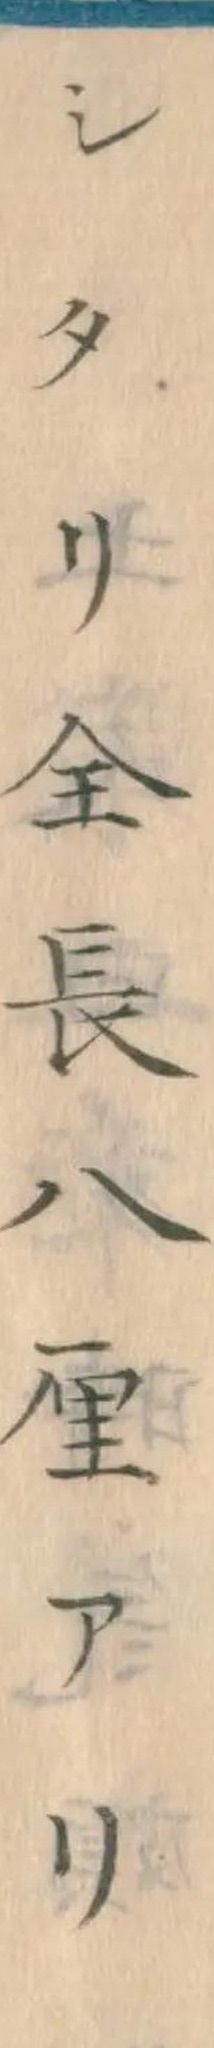シタリ全長八厘アリ
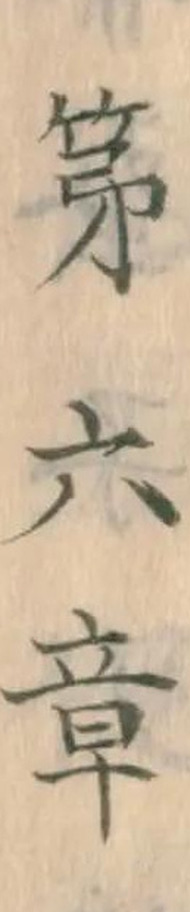第六章
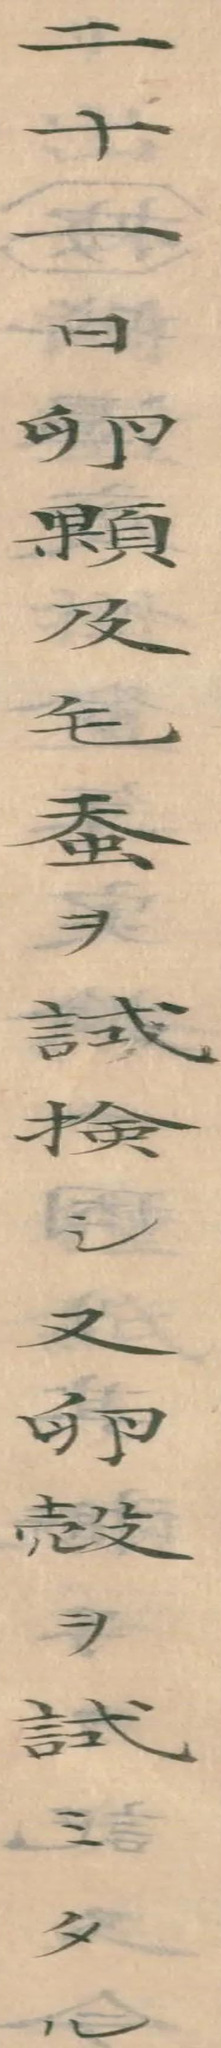二十一日卵顆及毛蚕ヲ試𢮦シ又卵殻ヲ試ミタル
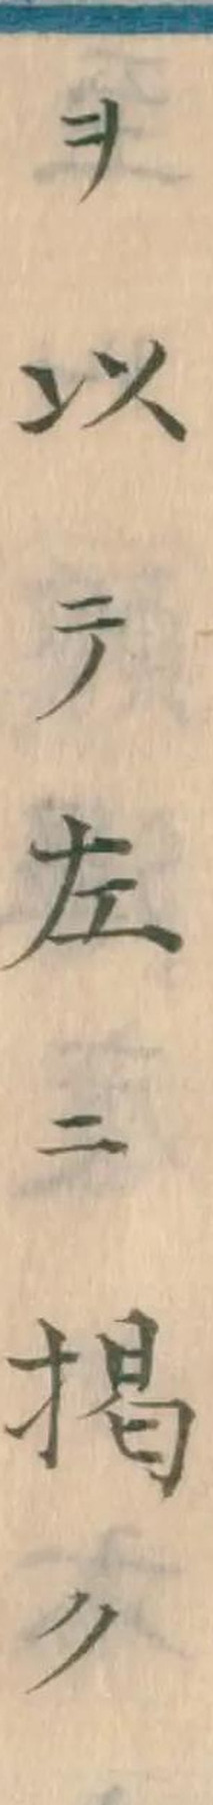ヲ以テ左ニ掲ク
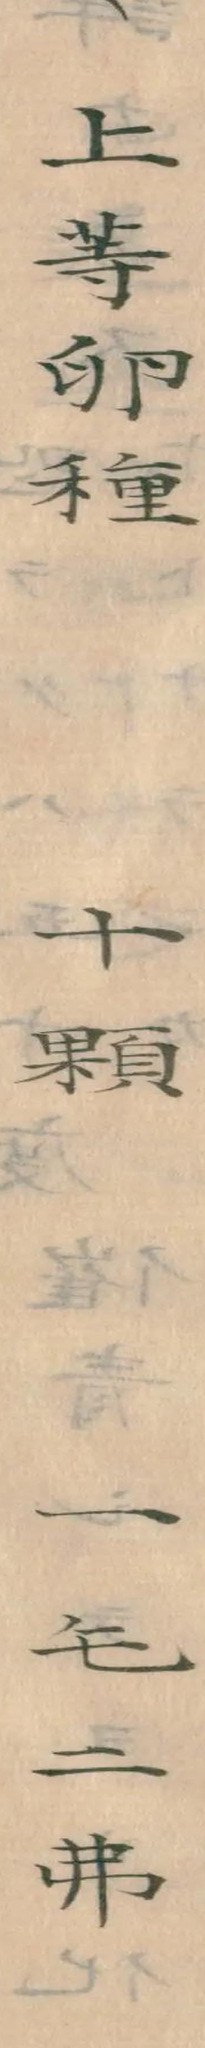┌上等卵種十顆一毛二弗
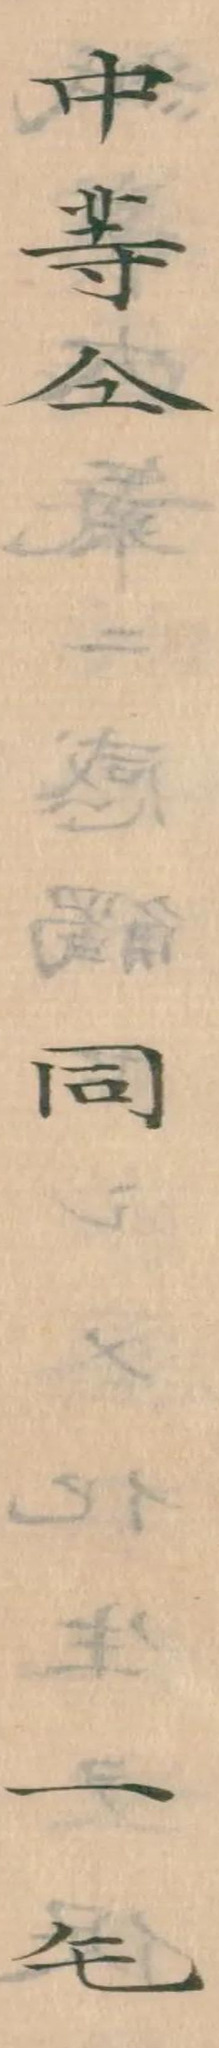│中等仝同一毛
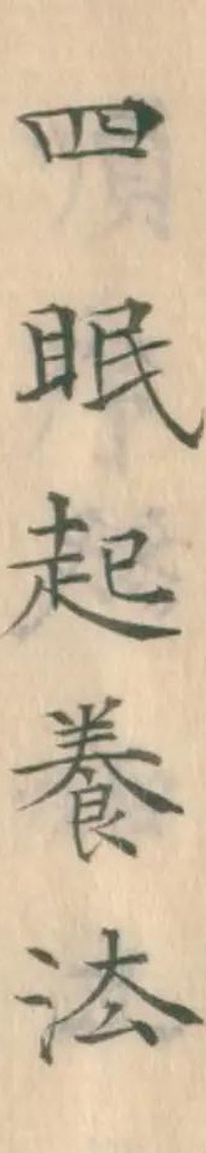四眠起養法
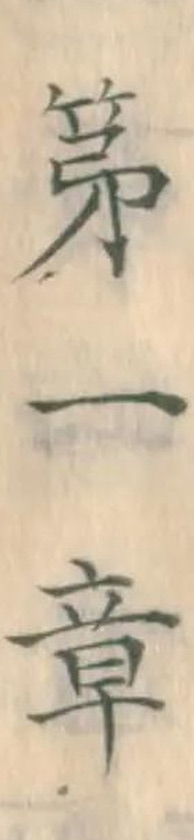第一章
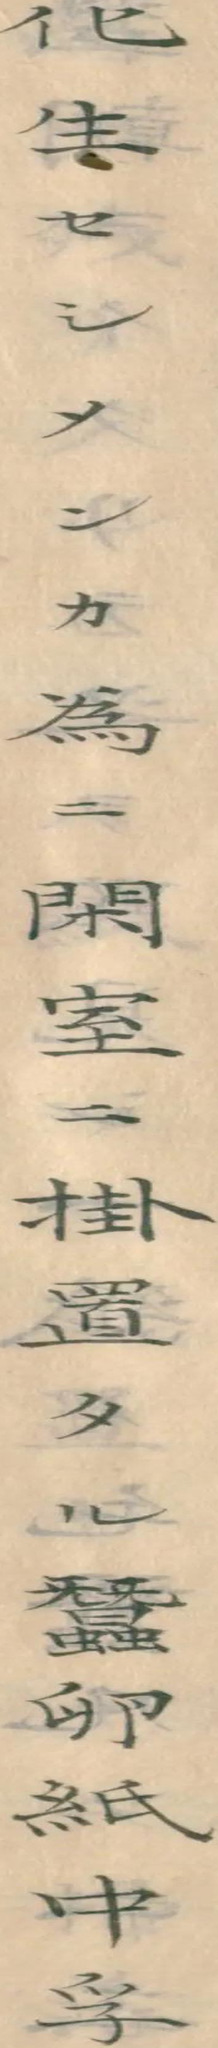化生セシメンカ為ニ閑室ニ掛置タル蚕卵紙中孚
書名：蚕桑集成
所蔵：国立国会図書館 National Diet Library, JAPAN
